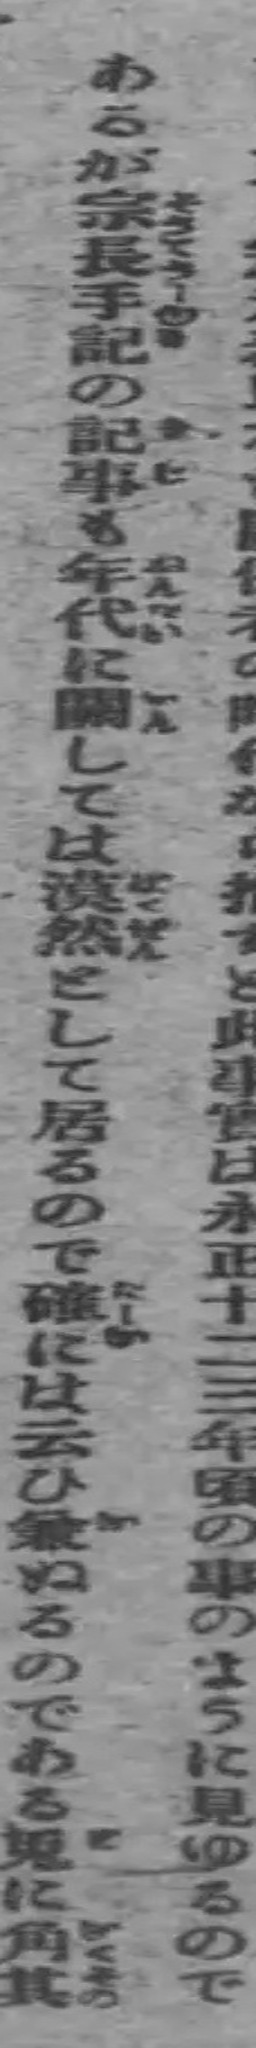あるが宗長手記の記事も年代に関しては漠然として居るので確には云ひ兼ぬるのである兎に角其
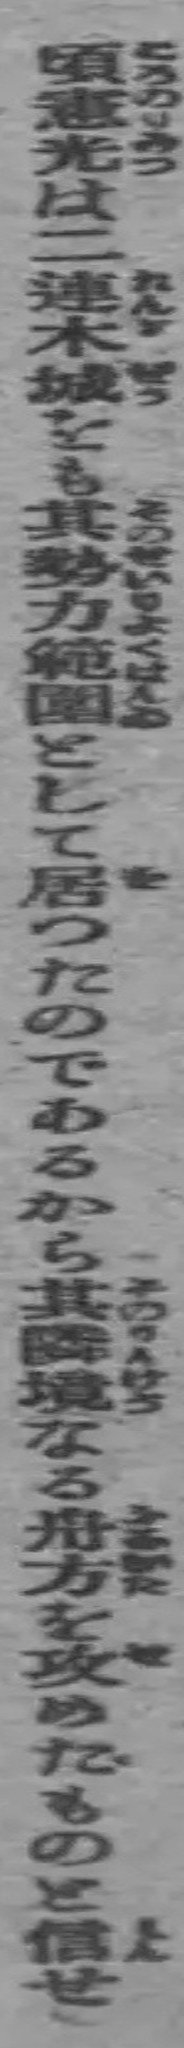頃憲光は二連木城をも其勢力範囲として居つたのであるから其隣境なる舟方を攻めたものと信せ
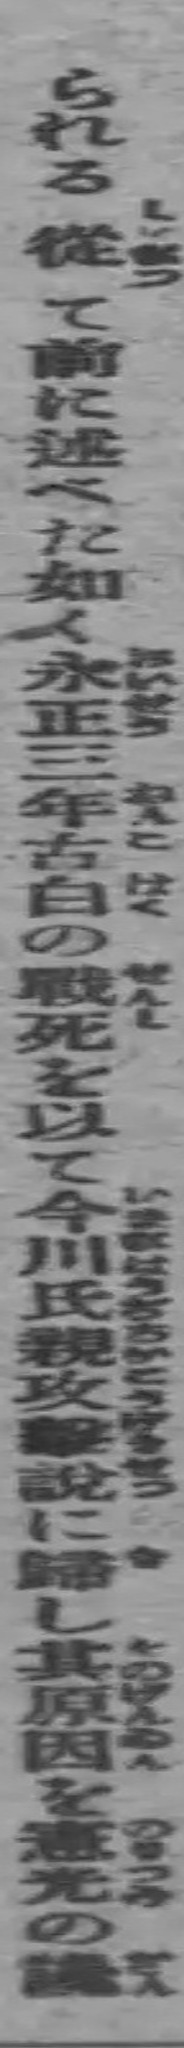られる従て前に述べた如く永正三年古白の戦死を以て今川氏親攻撃説に帰し其原因を憲光の讒
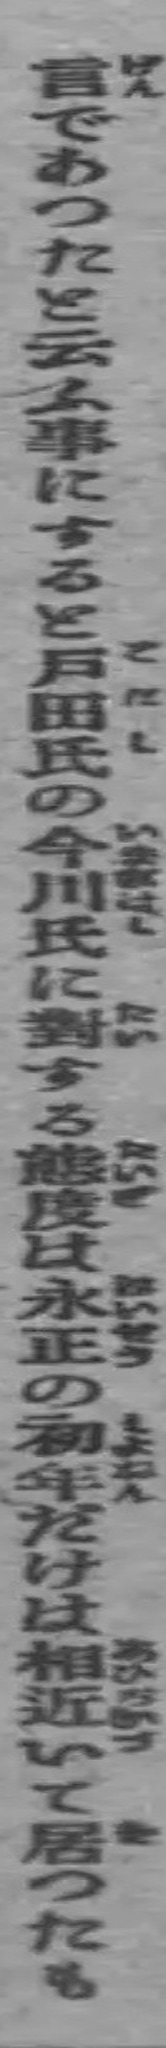言であつたと云ふ事にすると戸田氏の今川氏に対する態度は永正の初年だけは相近いて居つたも
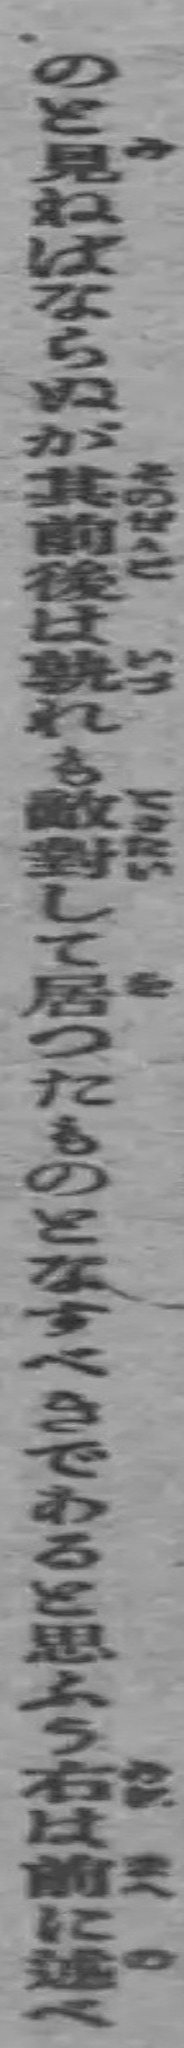のと見ねばならぬが其前後は孰れも敵対して居つたものとなすべきであると思ふう右は前に述べ
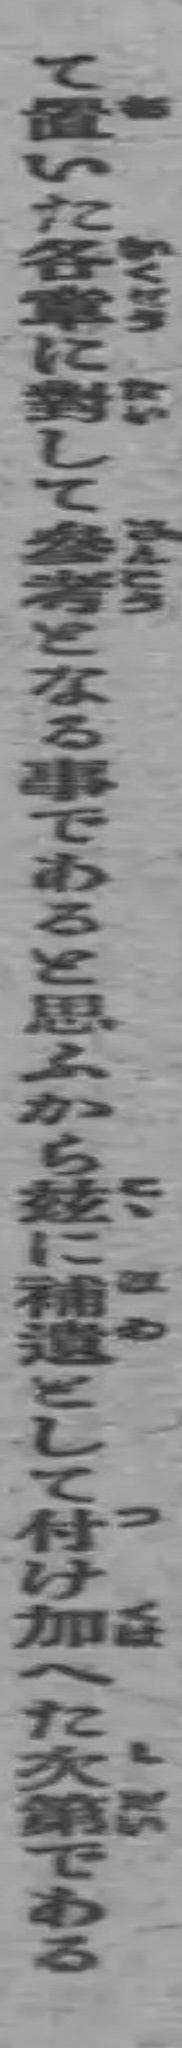て置いた各章に対して参考となる事であると思ふから茲に補遺として付け加へた次第である
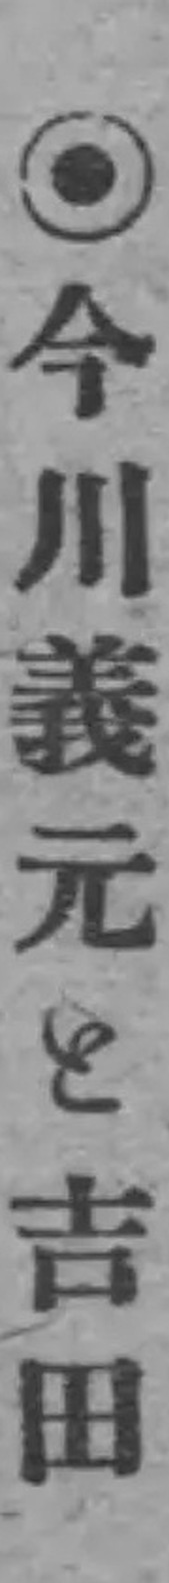◉今川義元と吉田
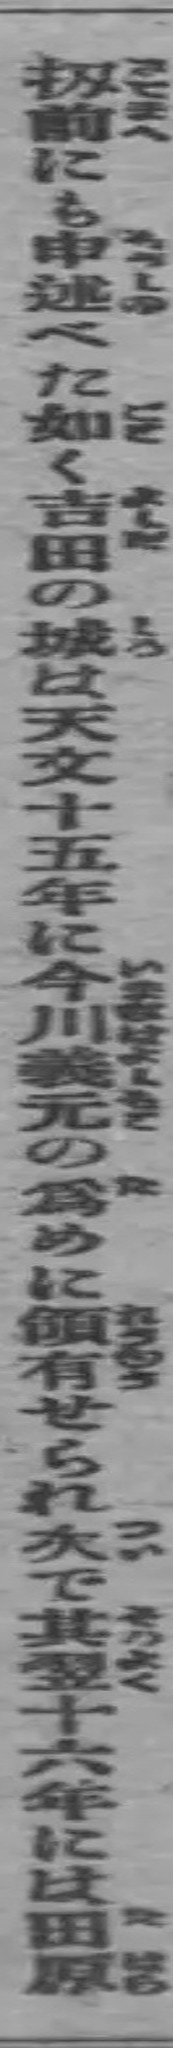扨前にも申述べた如く吉田の城は天文十五年に今川義元の為めに領有せられ次で其翌十六年には田原
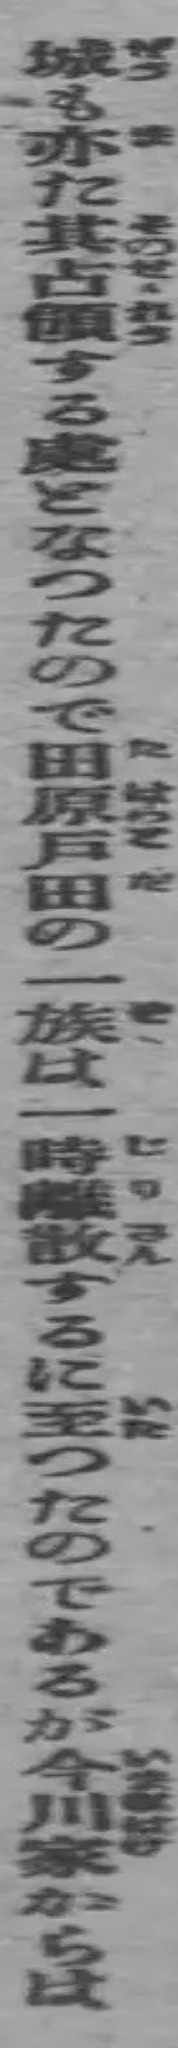城も亦た其占領する処となつたので田原戸田の一族は一時離散するに至つたのであるが今川家からは
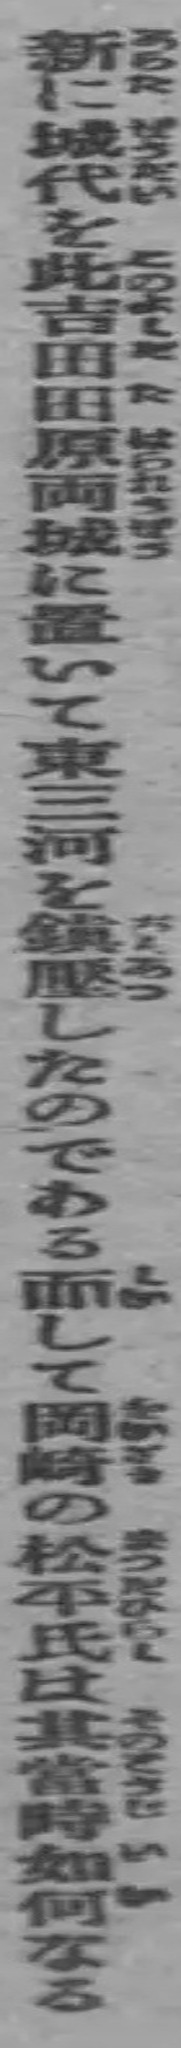新に城代を此吉田田原両城に置いて東三河を鎮圧したのである而して岡崎の松平氏は其当時如何なる
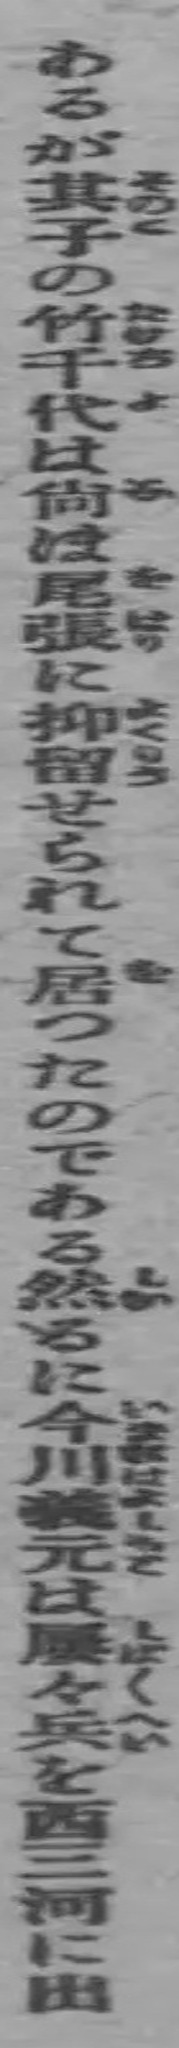あるが其子の竹千代は尚ほ尾張に抑留せられて居つたのである然るに今川義元は屡々兵をに西三河に出
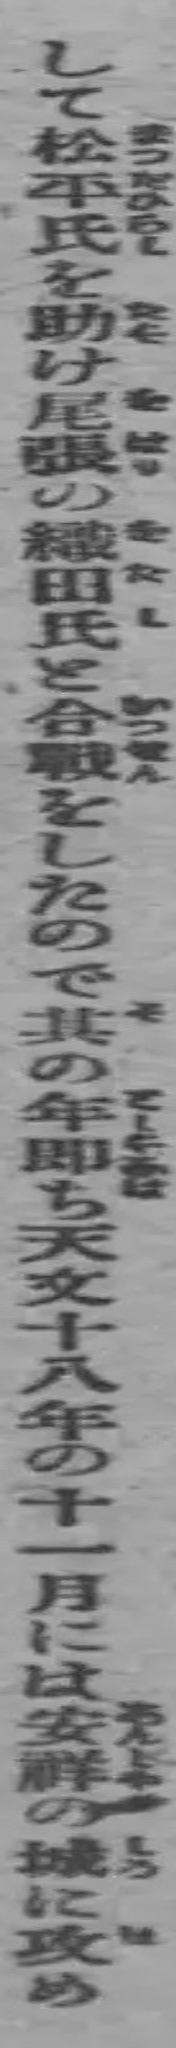して松平氏を助け尾張の織田氏と合戦をしたので其の年即ち天文十八年の十一月には安祥の城に攻め
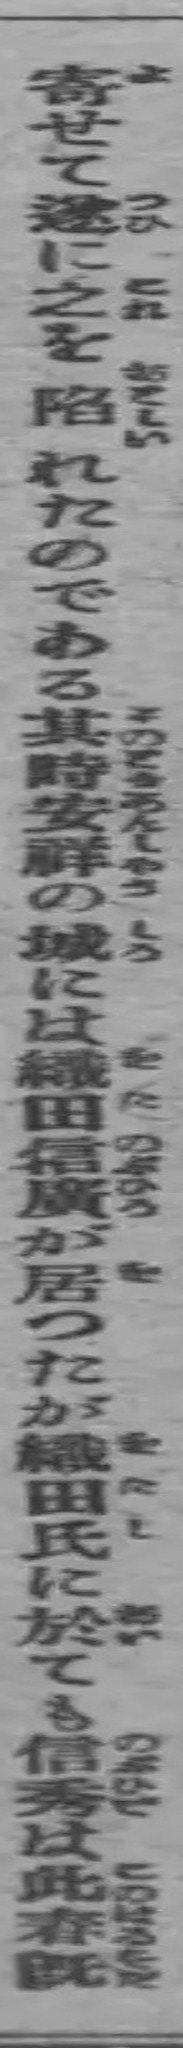寄せて遂に之を陥れたのである其時安祥の城には織田信広が居つたが織田氏に於ても信秀は此春既

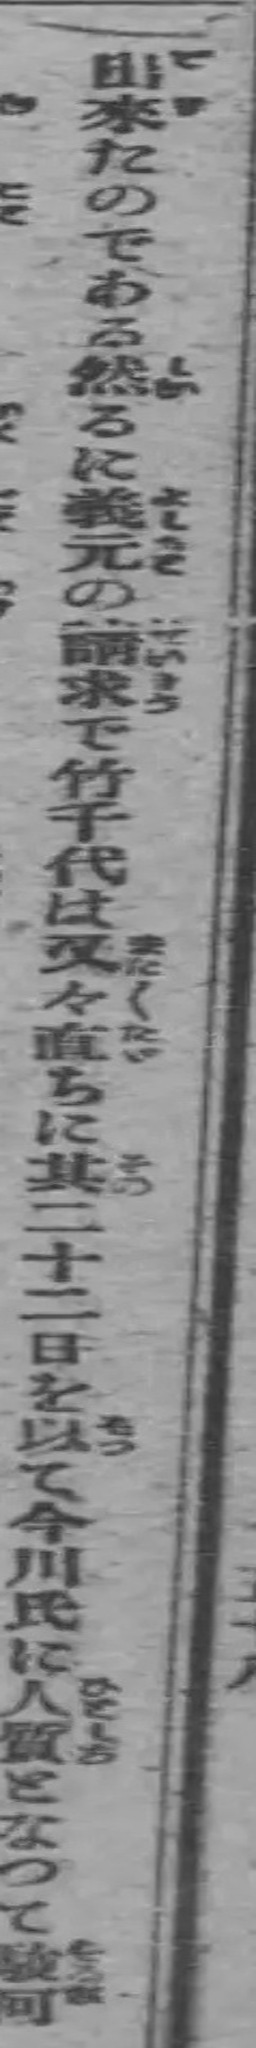出来たのである然るに義元の請求で竹千代は又々直ちに其二十二日を以て今川氏に人質となつて駿河
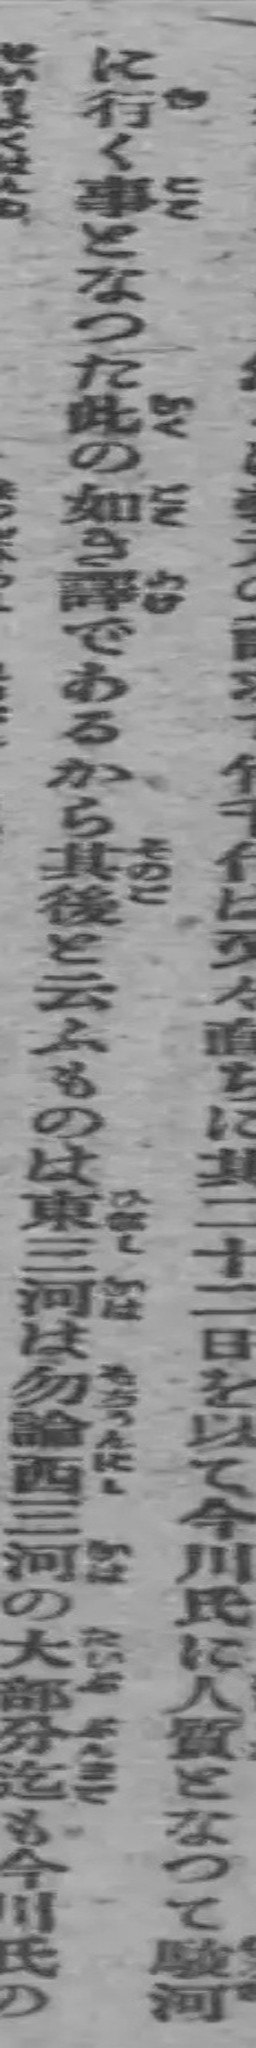に行く事となつた此の如き訳であるから其後と云ふものは東三河は勿論西三河の大部分迄も今川氏の
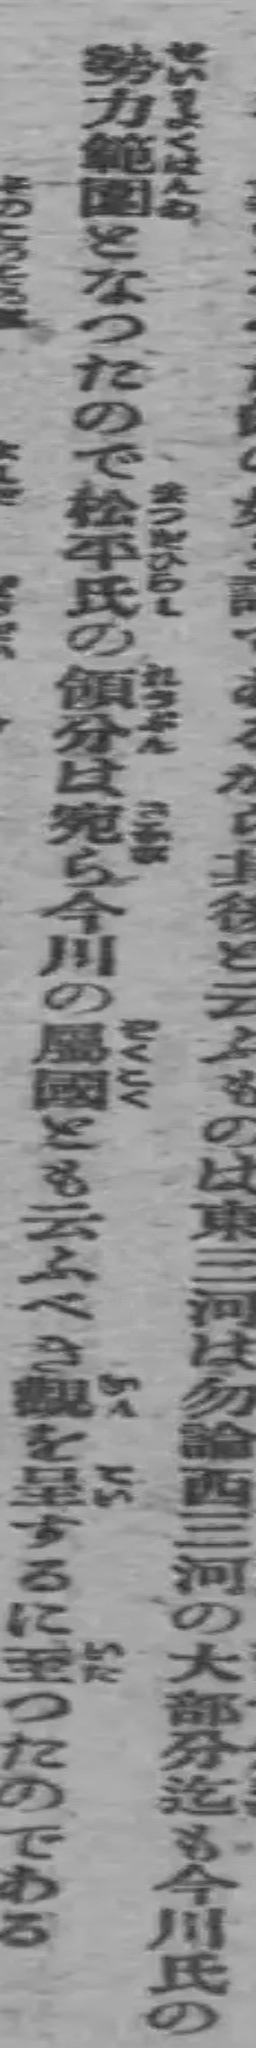勢力範囲となつたので松平氏の領分は宛ら今川の属国とも云ふべき観を呈するに至つたのである
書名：豊橋市史談
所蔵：国立国会図書館 National Diet Library, JAPAN
